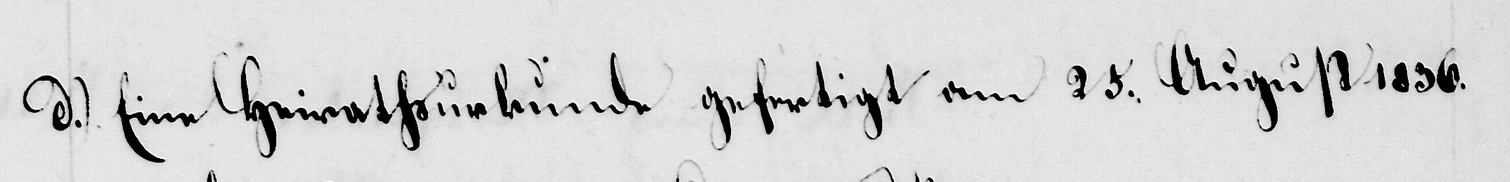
d.) Eine Heimathsurkunde gefertigt am 25. August 1836.
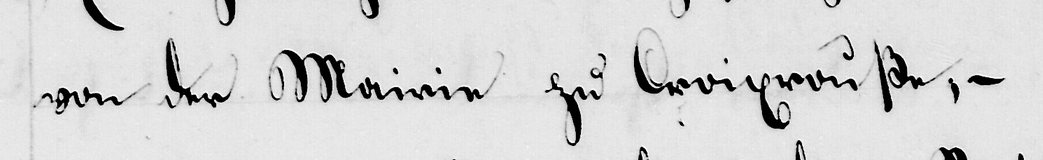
von der Mairie zu Croixrouße; –
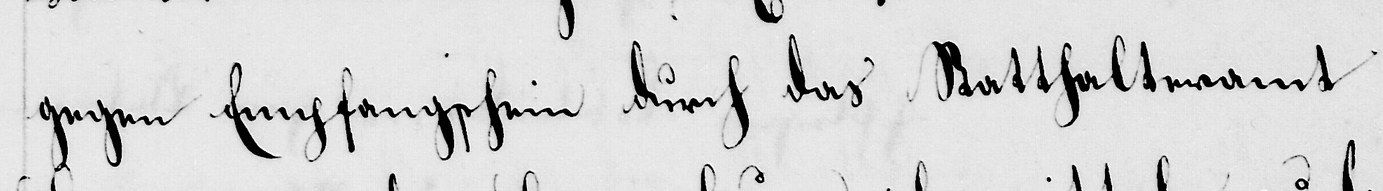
gegen Empfangschein durch das Statthalteramt
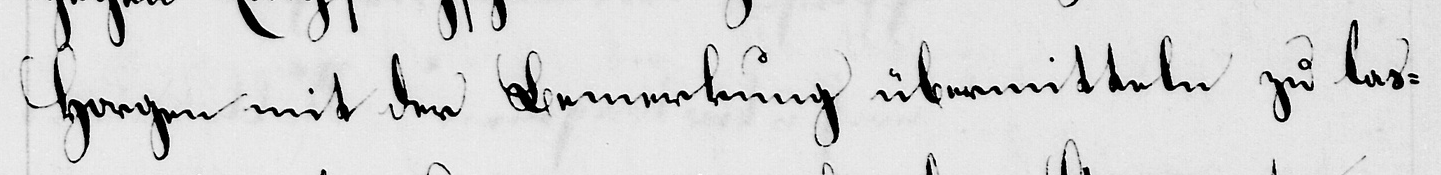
Horgen mit der Bemerkung übermitteln zu las¬
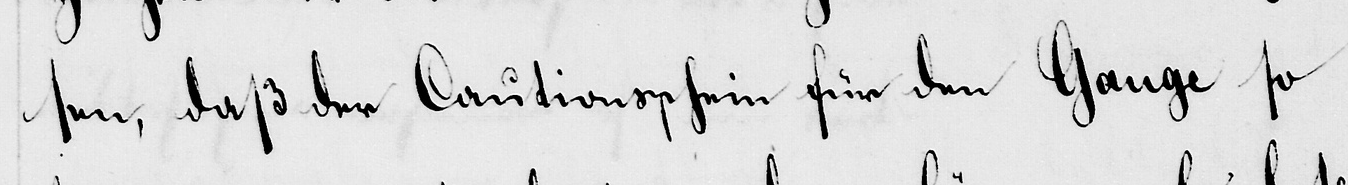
sen, daß der Cautionsschein für den Gauge so
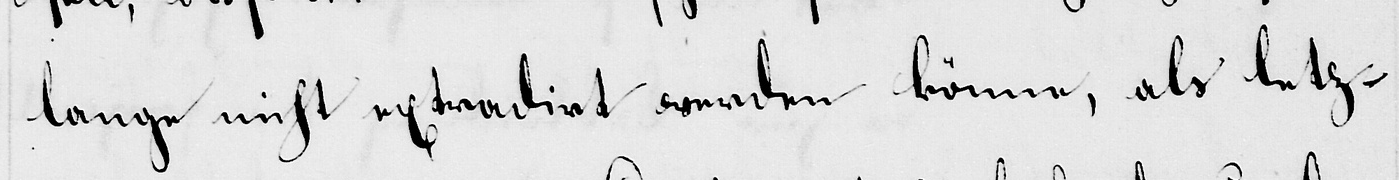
lange nicht extradirt werden könne, als letz¬
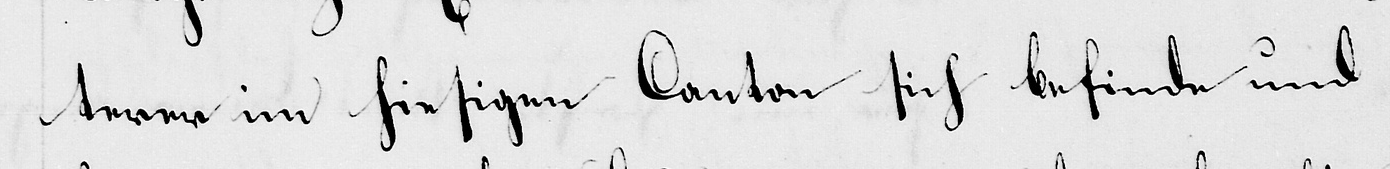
terer im hiesigen Canton sich befinde und
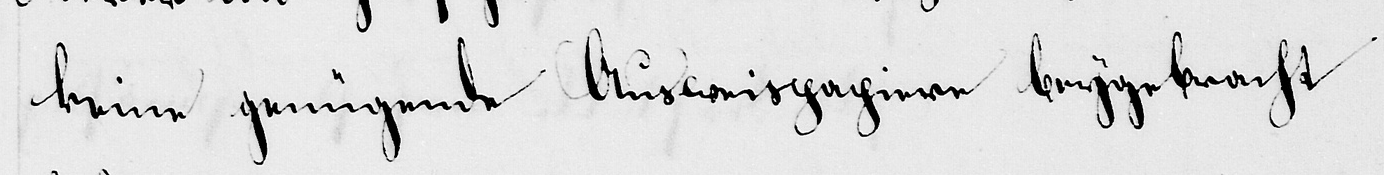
keine genügende Ausweispapiere beygebracht
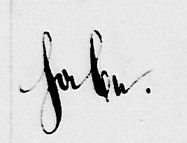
habe.
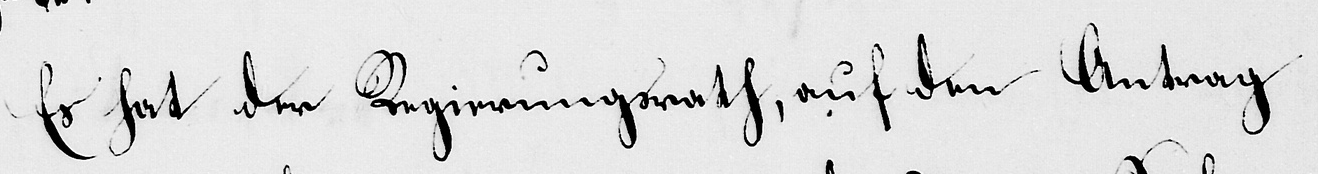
Es hat der Regierungsrath, auf den Antrag
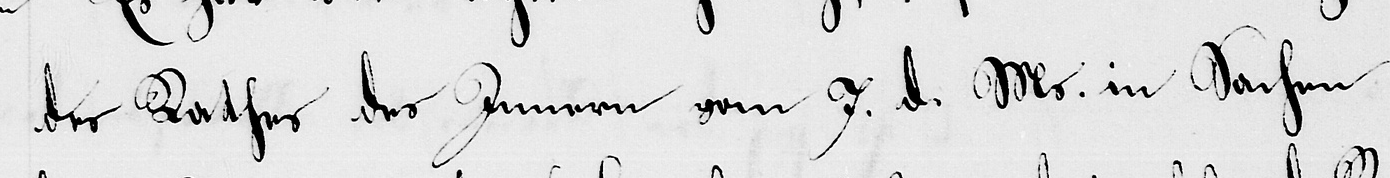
des Rathes des Innern vom 7. d. Ms. in Sachen
